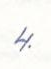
f4
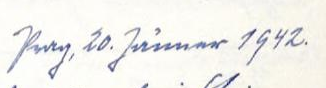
Prag, 20. Jänner 1942
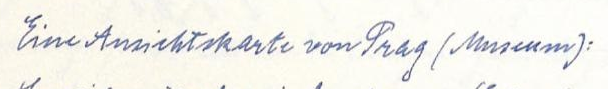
Eine Ansichtskarte von Prag (Museum)
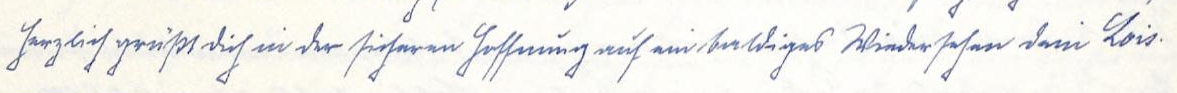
Herzlich grüßt dich in der sicheren Hoffnung auf ein baldiges Wiedersehen dein Lois.
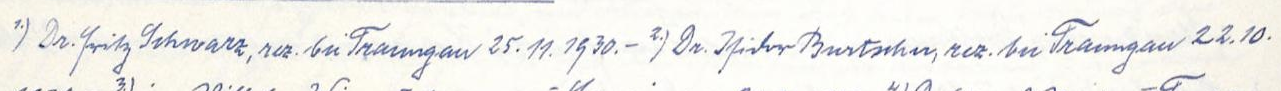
1) Dr. Fritz Schwarz, rez. bei Traungau 25. 11. 1930. - 2) Dr. Isidor Burtschen, rez. bei Traungau 22. 10.
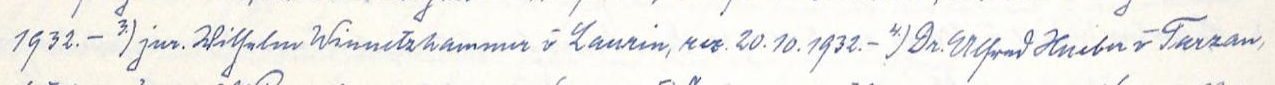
1932.- 3) iur. Wilhelm Weinetzhammer v/o Laurin, rez. 20. 10. 1932. - 4) Dr. Alfred Huber v/o Tarzan,
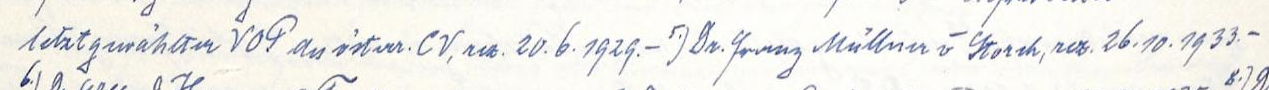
letztgewählter österr. VOP des österr. CV, rez. 20. 6. 1929.- 5) Dr. Franz Müller v/o Storch, rez. 26.10. 1933.-
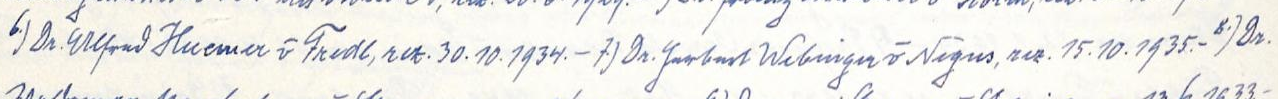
6) Dr. Alfred Hauser v/o Triendl, rez. 30. 10. 1934.- ) Dr. Herbst Webinger v/o Negus, rez. 15. 10. 1930. 8)
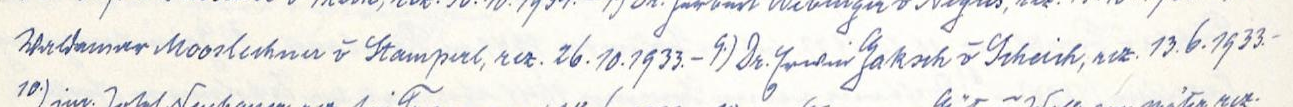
Waldemar Mooslechner v/o Stampal, rez. 26. 10.1933. - P) Dr. Erwin Haksc hv/o Scheich, rez. 13. 6. 1933
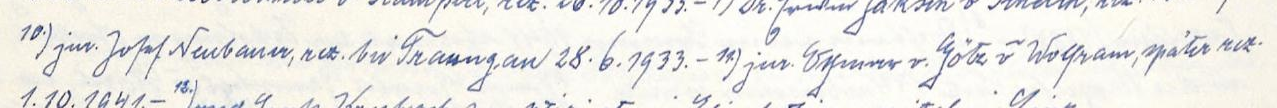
10) iur Josef Neubauer, rez. bei Braunau 28. 6. 1933. - 11) iur. Othmar Götz v/o Wolfram, später rez,
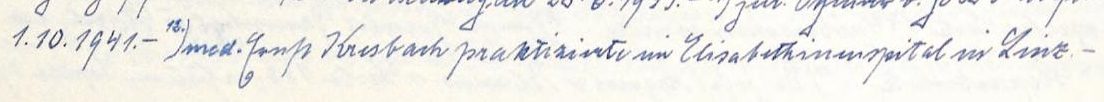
1. 10. 1941. - 12)med. Ernst Kresbach praktizierte im Elisabetinenspital in Linz.
